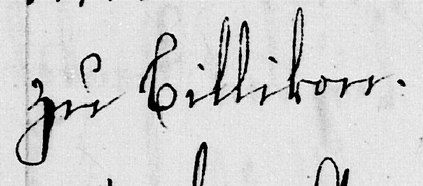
zu Billikon.
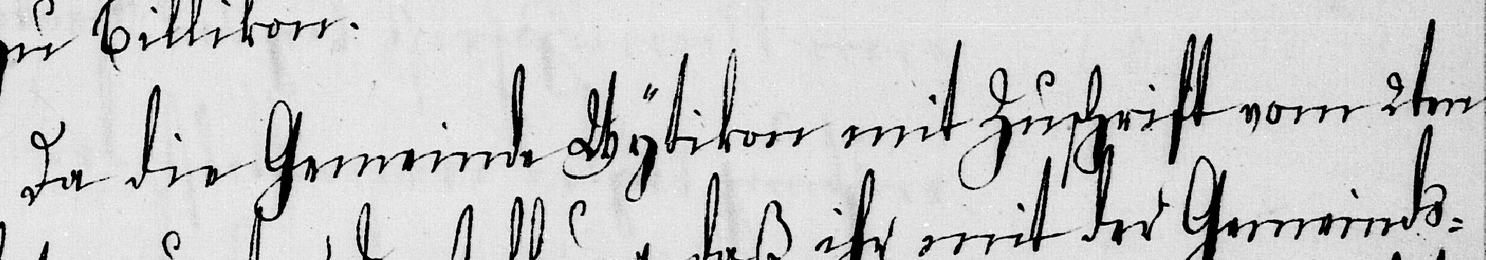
Da die Gemeinde Wytikon mit Zuschrift vom 2ten
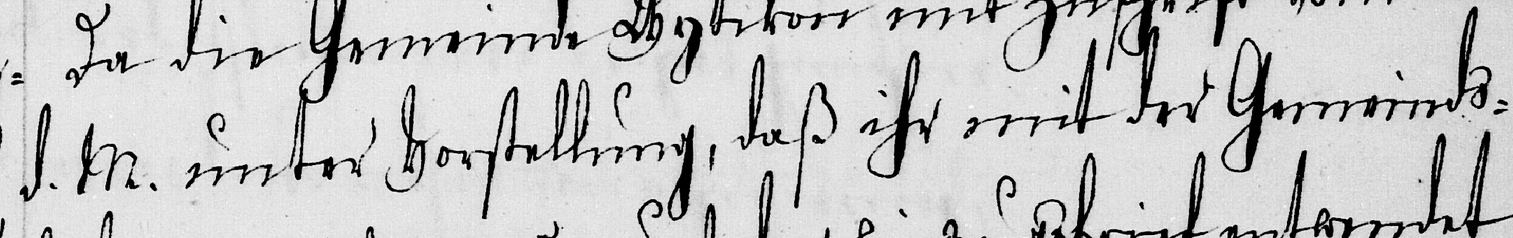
d. M. unter Vorstellung, daß ihr mit der Gemeinds¬
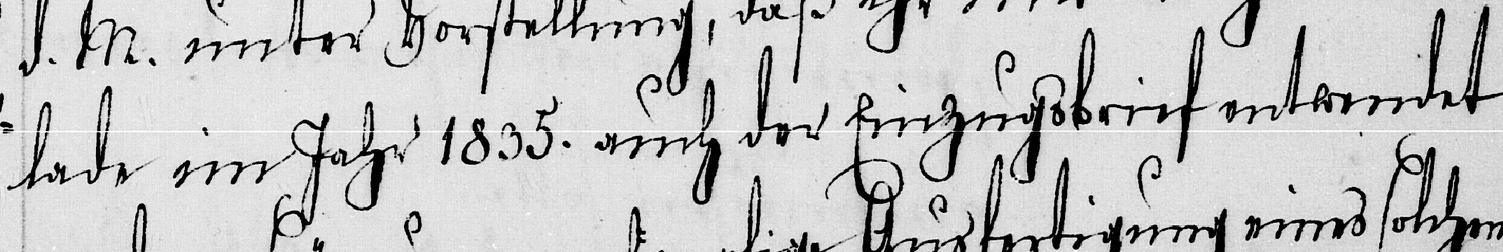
lade im Jahr 1835. auch der Einzugsbrief entwendet
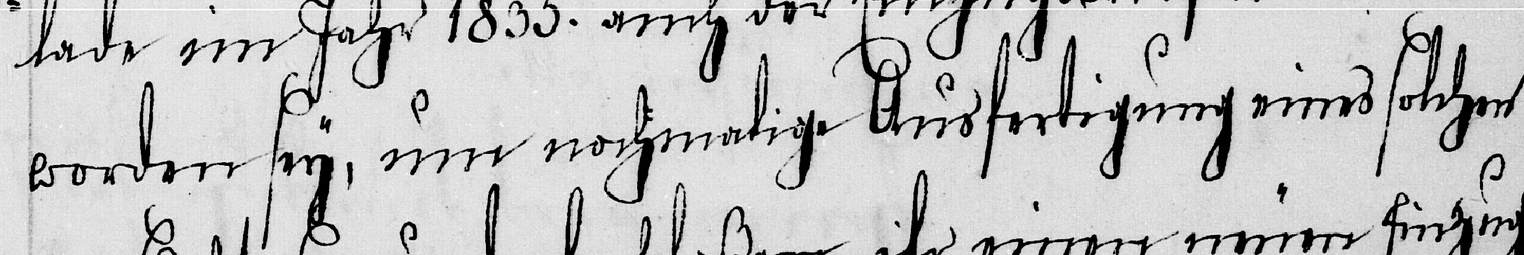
worden sey, um nochmalige Ausfertigung eines solchen
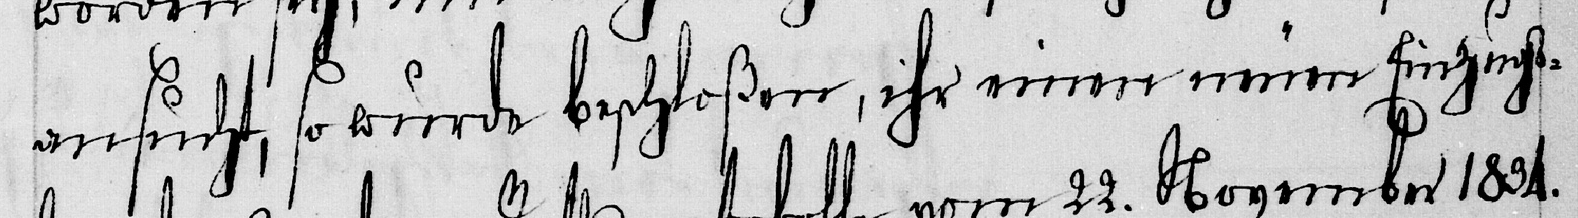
ansucht, so wurde beschloßen, ihr einen neuen Einzugs¬
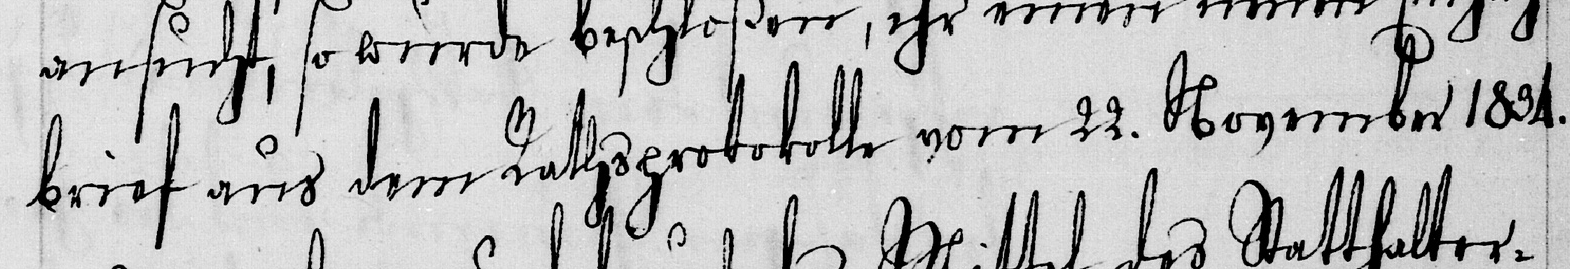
brief aus dem Rathsprotokolle vom 22. November 1834.
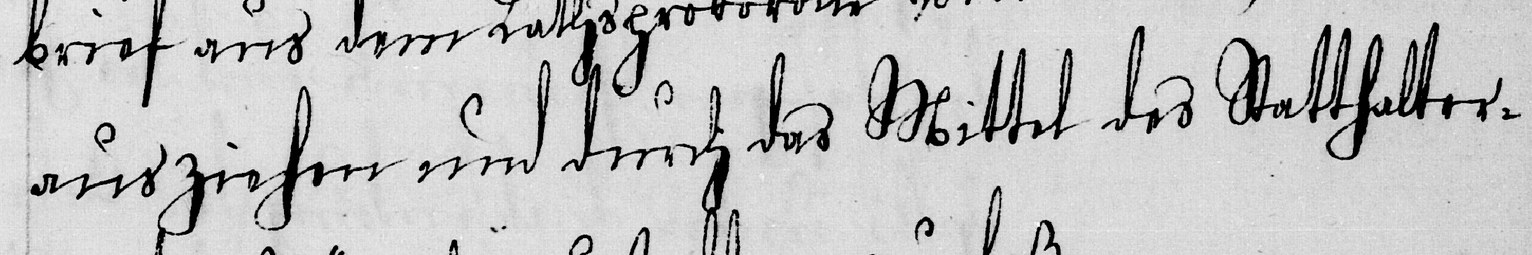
ausziehen und durch das Mittel des Statthalter¬
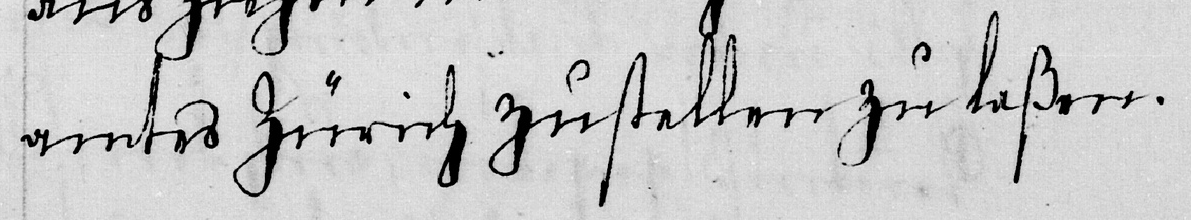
amtes Zürich zustellen zu laßen.
